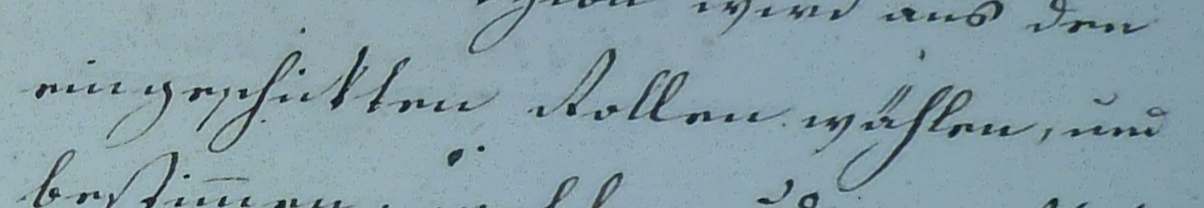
eingeschickten Rollen wählen, und
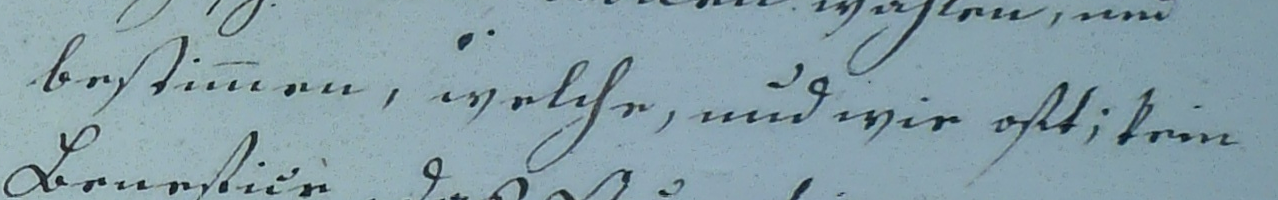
bestim̅en, welche, und wie oft; kein
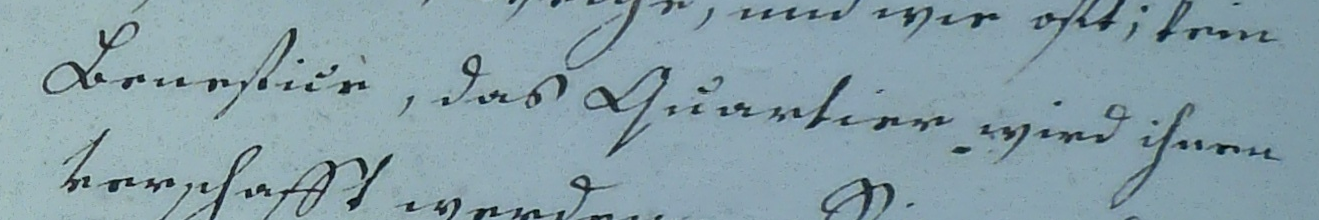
Benefice, das Quartier wird ihnen
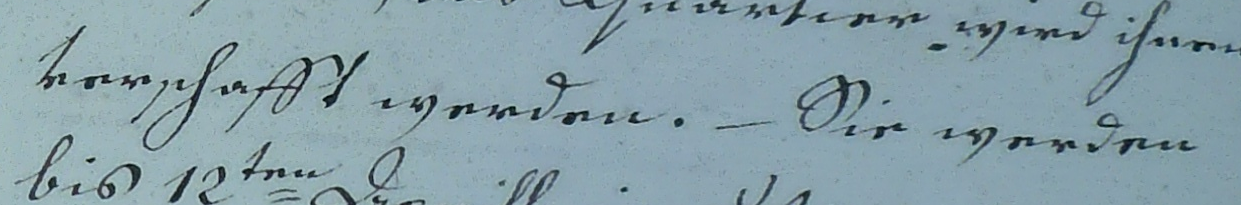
verschafft werden. _ Sie werden
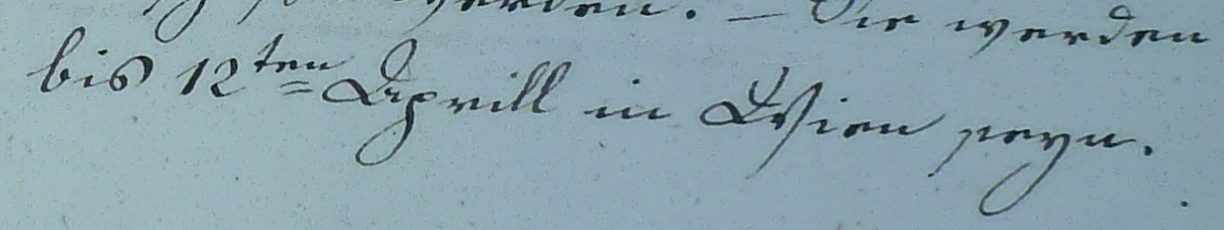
bis 12te̳n Aprill in Wien seyn.
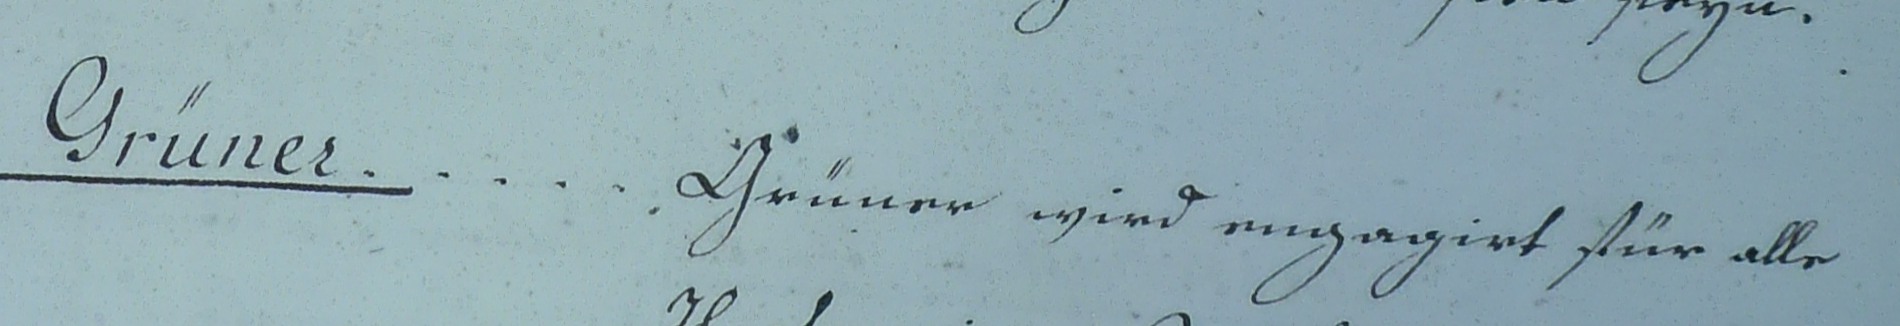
Grüner . . . . . Grüner wird engagirt für alle
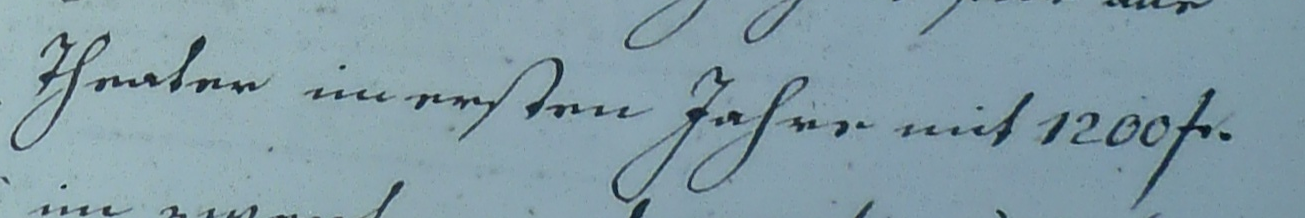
Theater im ersten Jahre mit 1200fr.
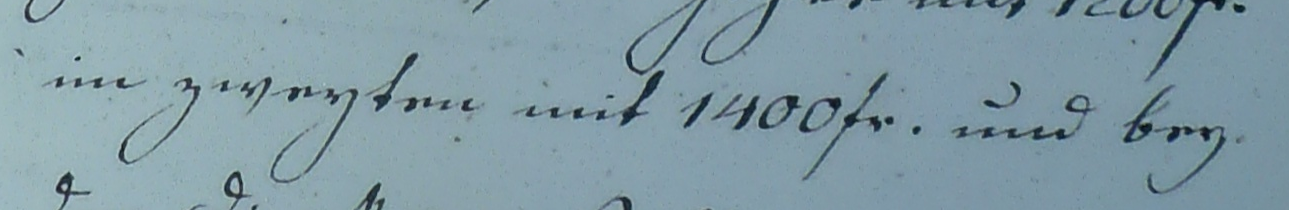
im zweyten mit 1400fr. und bey
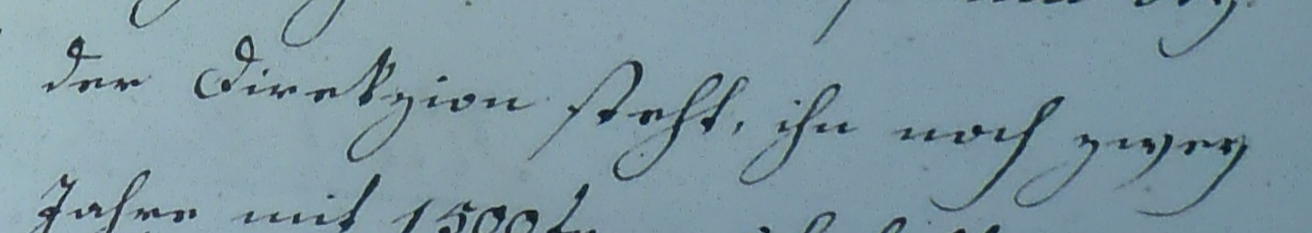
der Direkzion steht, ihn noch zwey
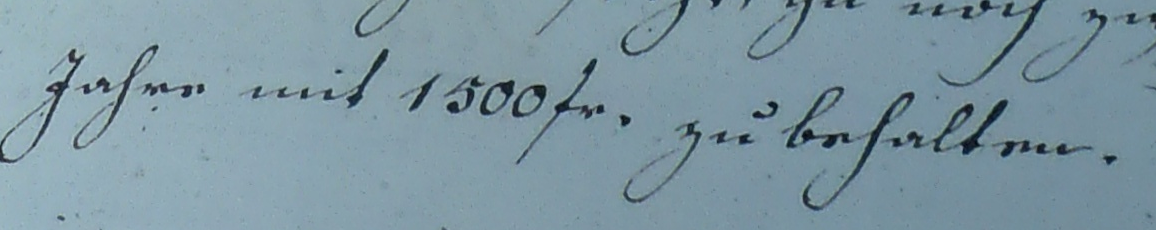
Jahre mit 1500fr. zu behalten.
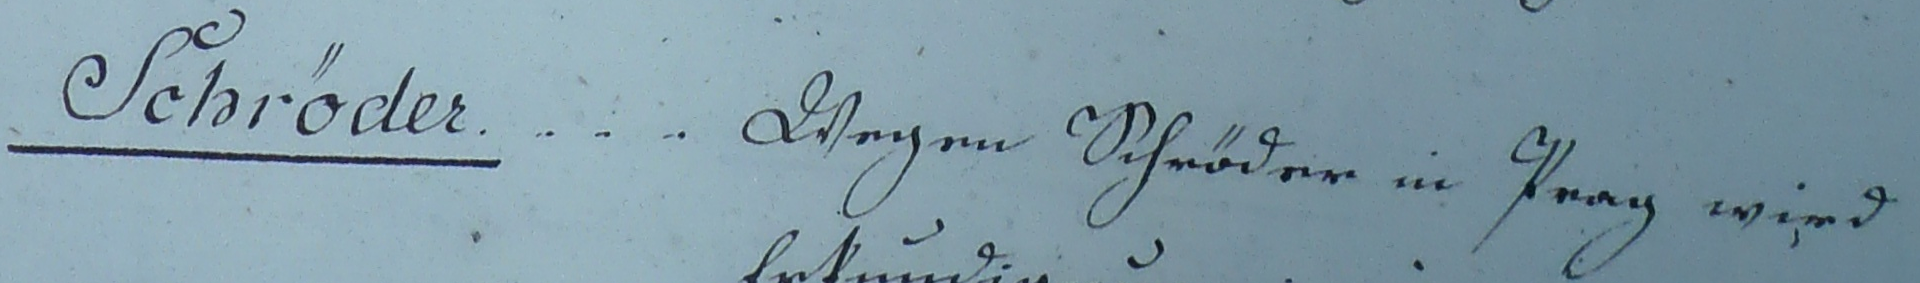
Schröder. .. .. .. Wegen Schröder in Prag wird
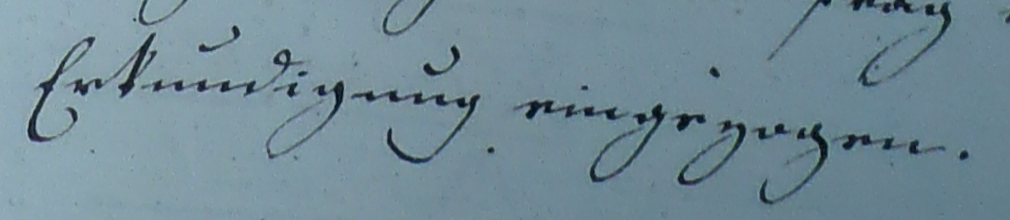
Erkundigung eingezogen.
